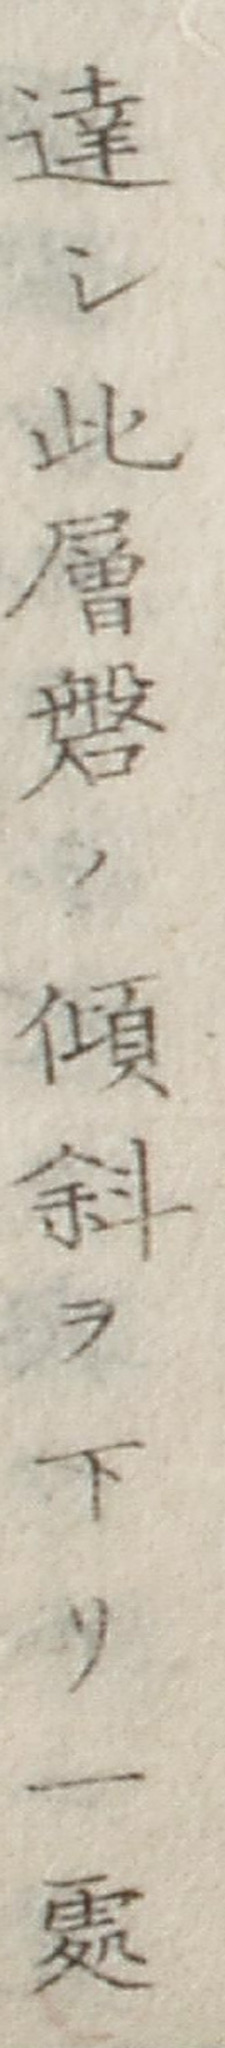達シ此層磐ノ傾斜ヲ下リ一處
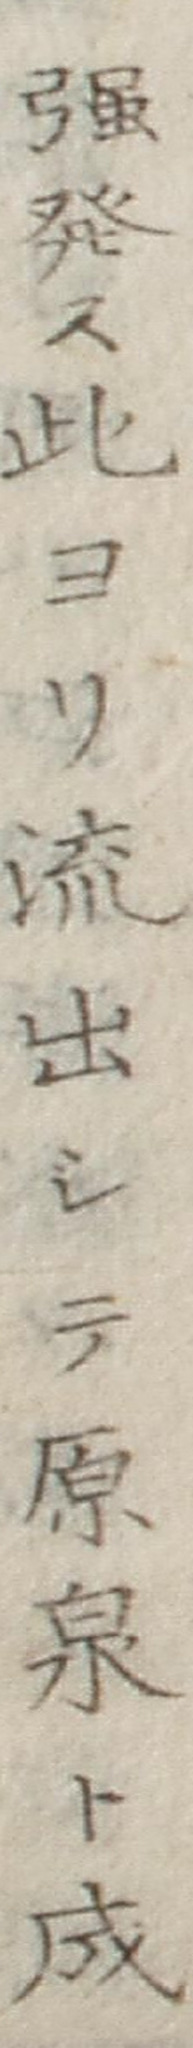強発ス此ヨリ流出シテ原泉ト成

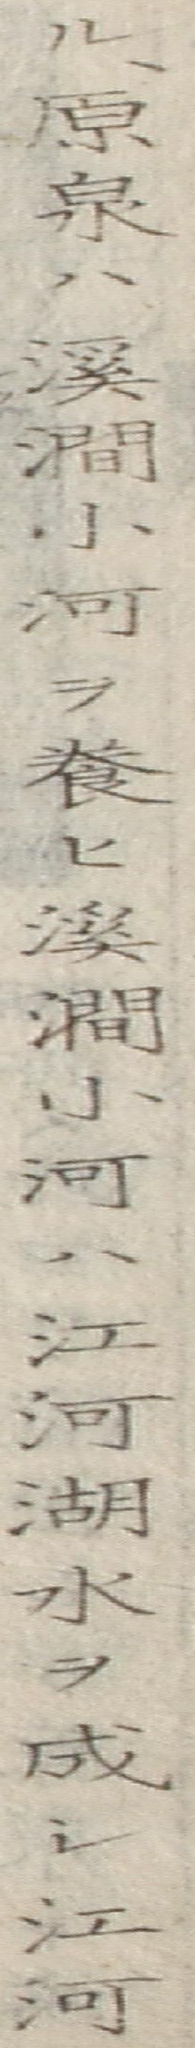ル、原泉ハ渓澗小河ヲ養ヒ渓澗小河ハ江河湖水ヲ成シ江河
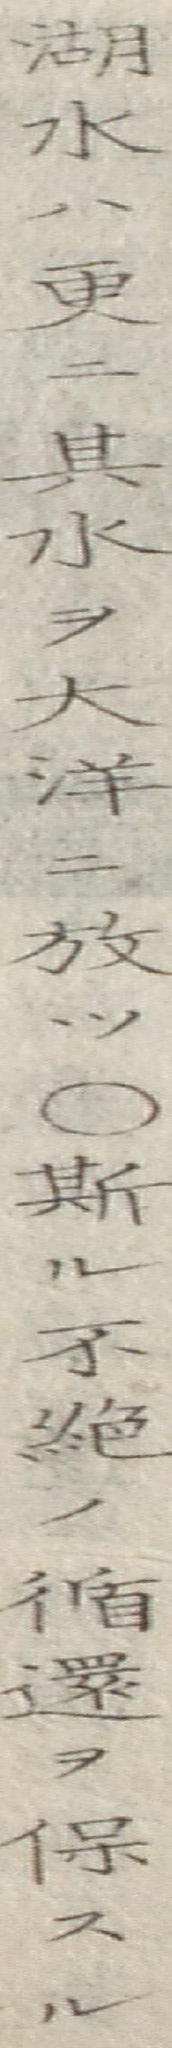湖水ハ更ニ其水ヲ大洋ニ放ツ○斯ル不絶ノ循還ヲ保スル
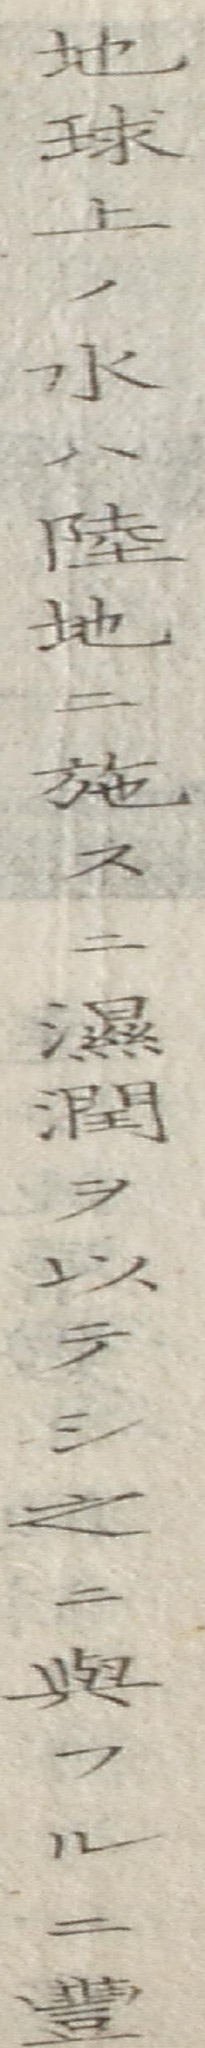地球上ノ水ハ陸地ニ施スニ湿潤ヲ以テシ之ニ與フルニ豊
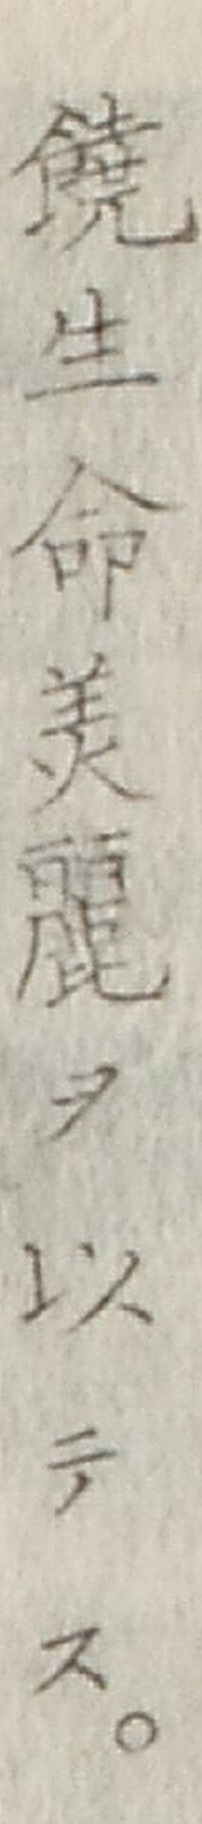饒生命美麗ヲ以テス。
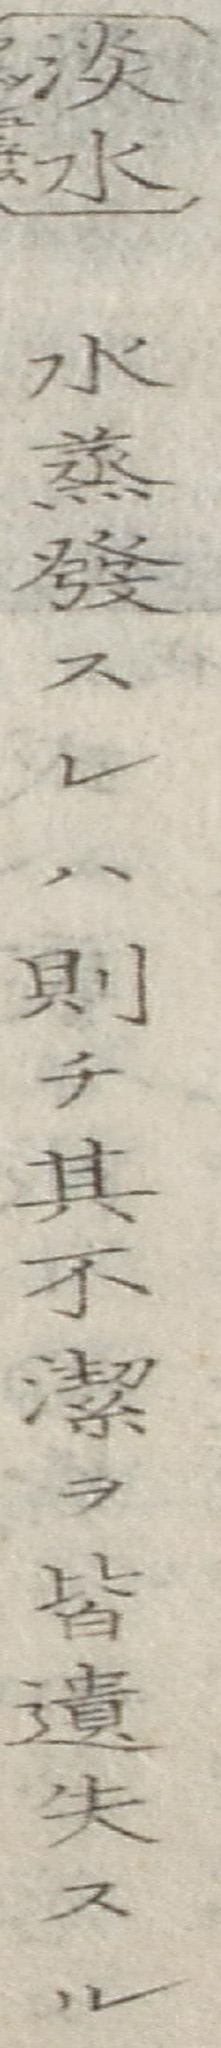三〔淡水〕水蒸発スレハ則テ不潔ヲ皆遺失スル
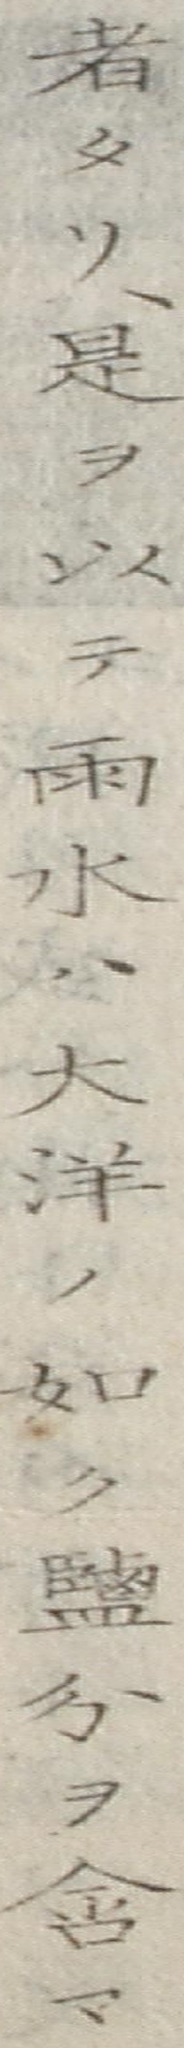者タリ、是ヲ以テ雨水ハ大洋ノ如ク塩分ヲ含マ
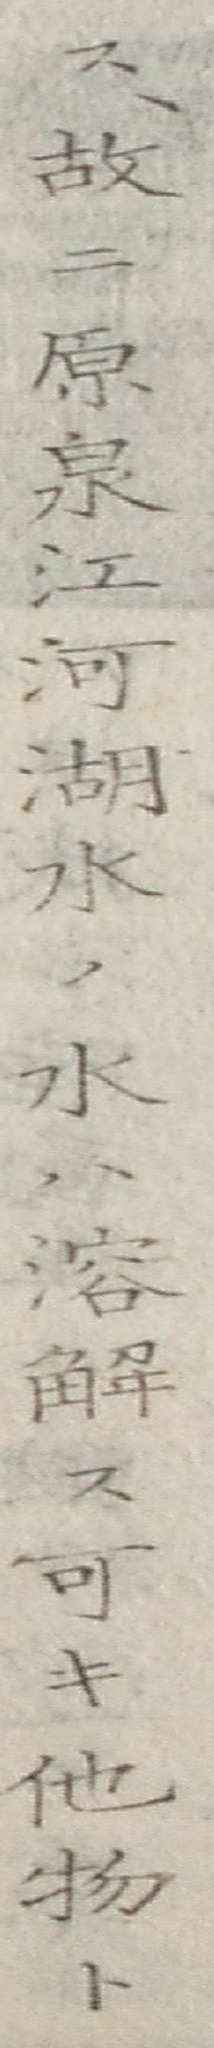ス、故ニ原泉江河湖水ノ水ハ溶解ス可キ他物ト
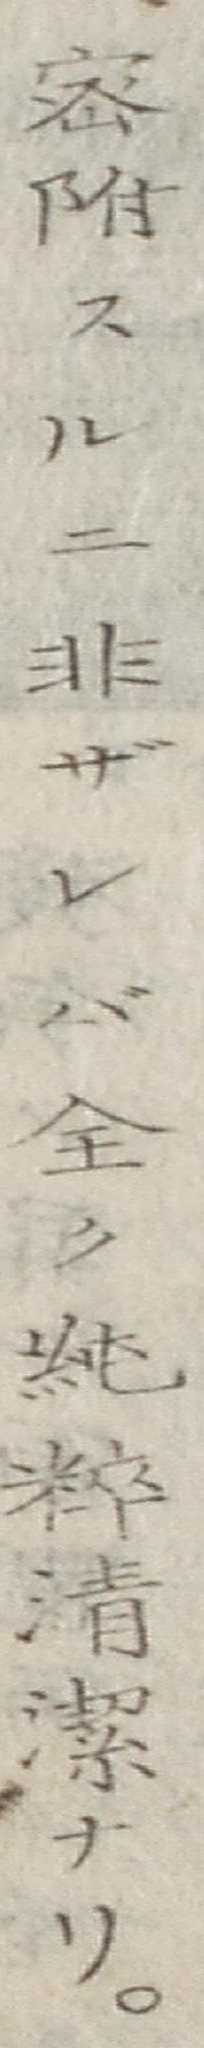密附スルニ非ザレバ全ク純粋清潔ナリ。
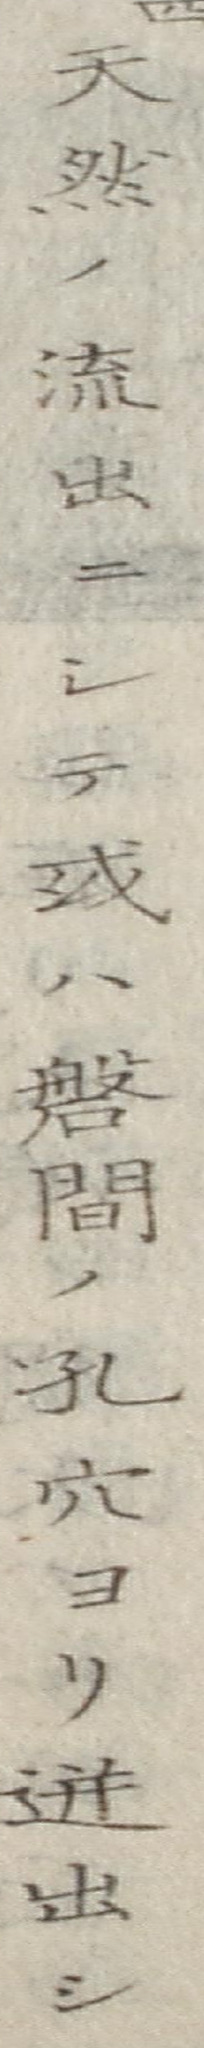四天然ノ流出ニシテ或ハ磐間ノ孔穴ヨリ迸出シ
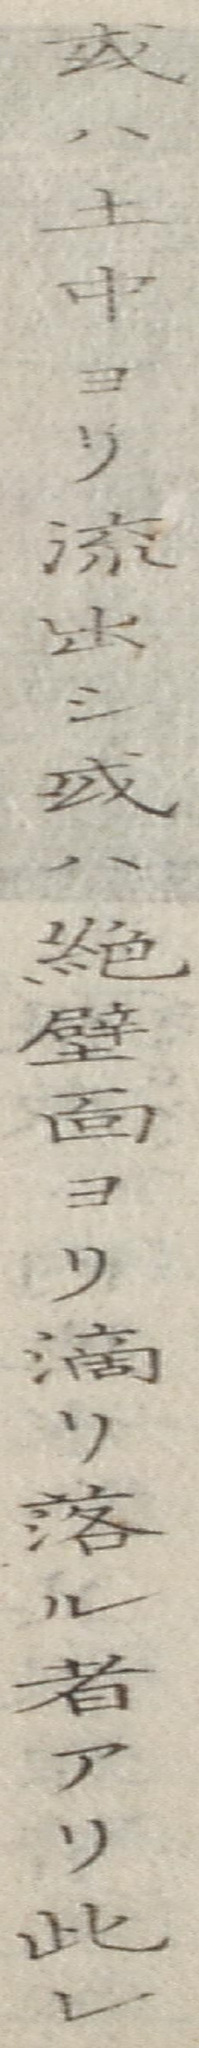或ハ土中ヨリ流出シ或ハ絶壁面ヨリ滴リ落ル者アリ此レ
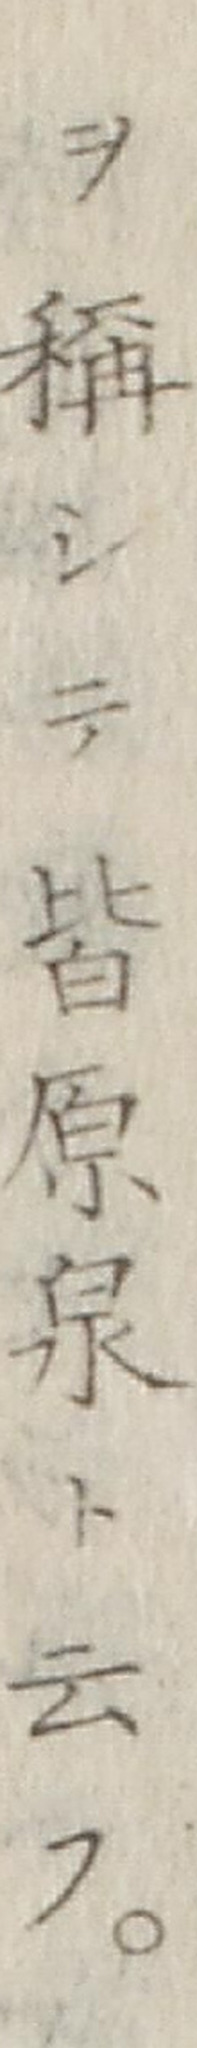ヲ稱シテ皆原泉ト云フ。
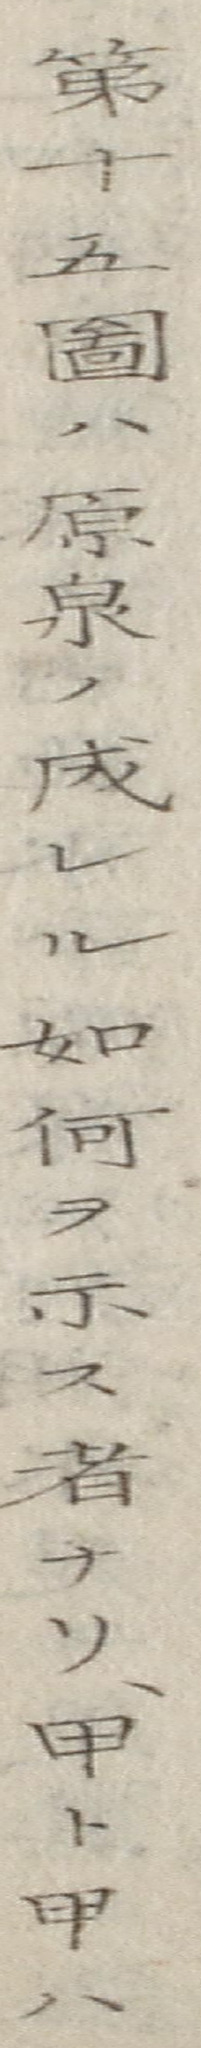第十五図ハ原泉ノ成レル如何ヲ示ス者ナリ、甲ト甲ハ
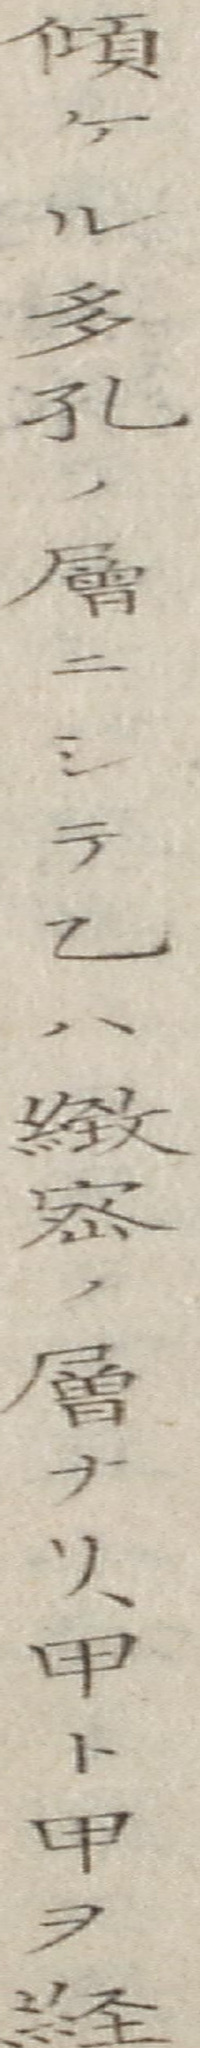傾ケル多孔ノ層ニシテ乙ハ緻密ノ層ナリ、甲ト甲ヲ経
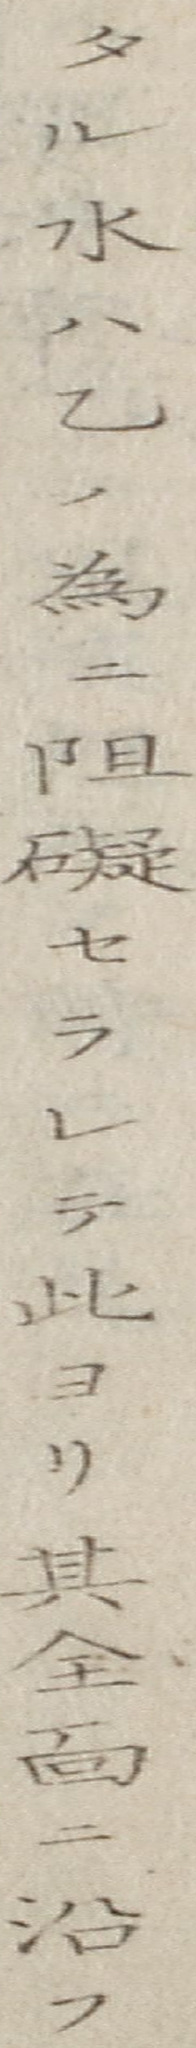タル水ハ乙ノ為ニ阻礙セラレテ此ヨリ其全面ニ沿フ
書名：地形論　巻二
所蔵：東京大学地震研究所図書室 Earthquake Research Institute Library, The University of Tokyo, JAPAN
